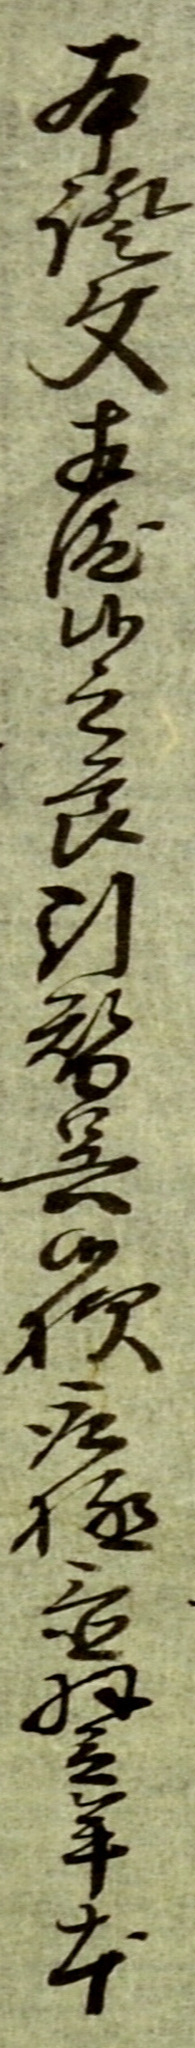本証文相渡候之節引替呉候様取極置翌年本
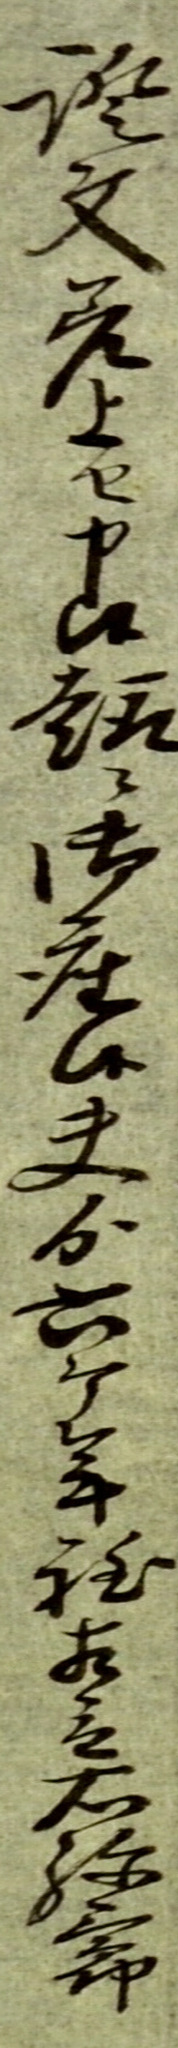証文差よセ申候趣ニ御座候夫ゟ六ケ年程相立右弥三郎
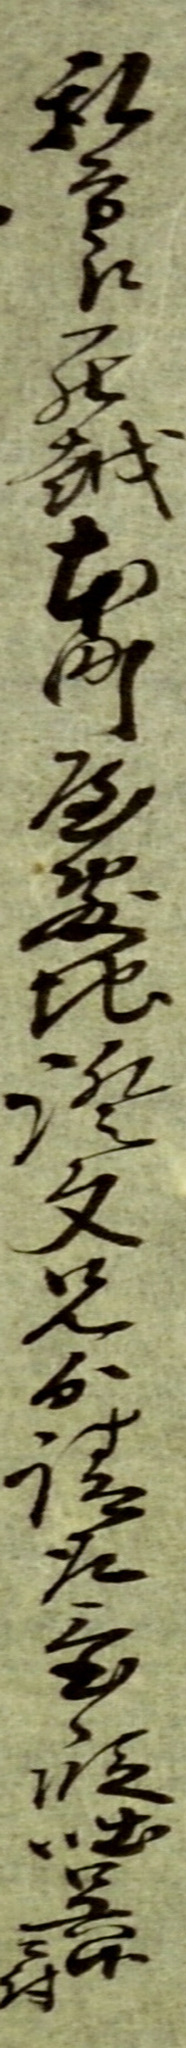私方江罷越本町屋敷地証文兄ゟ請取置候段咄呉候ニ付
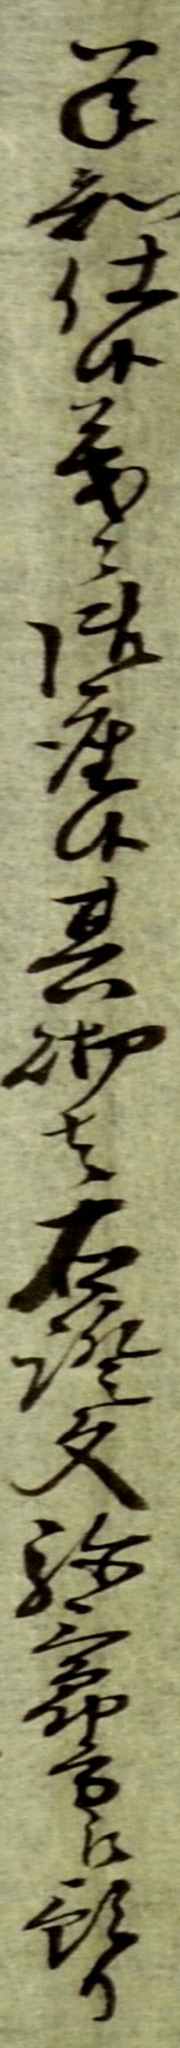承知仕候義ニ御座候其砌者右証文弥三郎方江預り
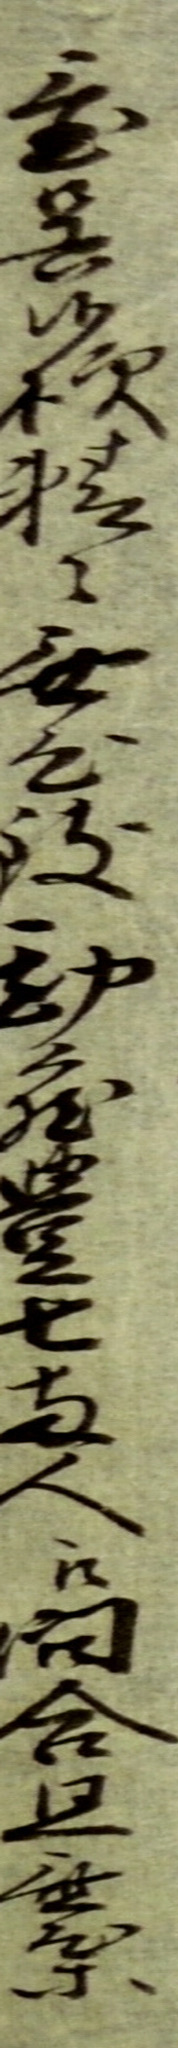置呉候様精々無心致勘蔵豊七両人江問合且無心等

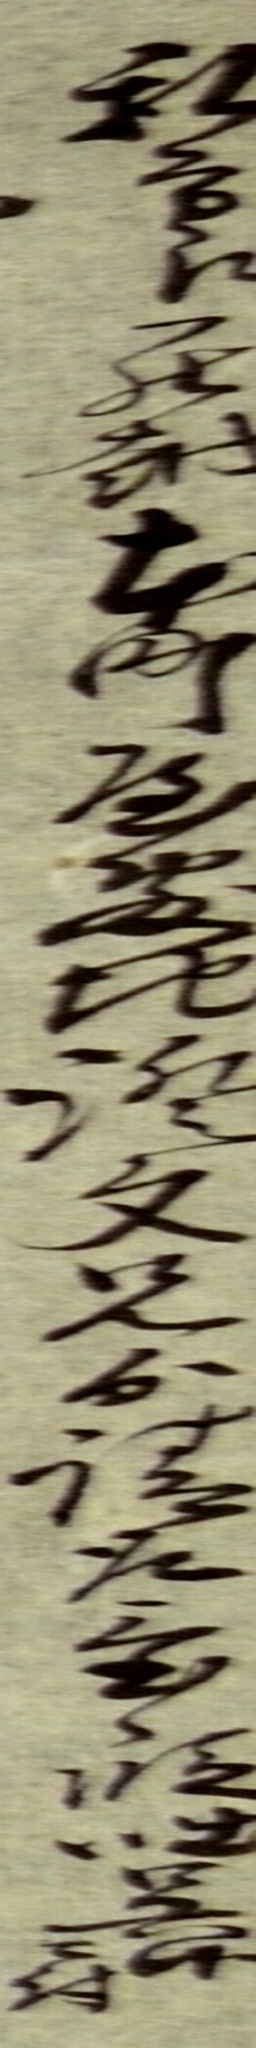私方江罷越本町屋敷地証文兄ゟ請取置候段咄呉候ニ付
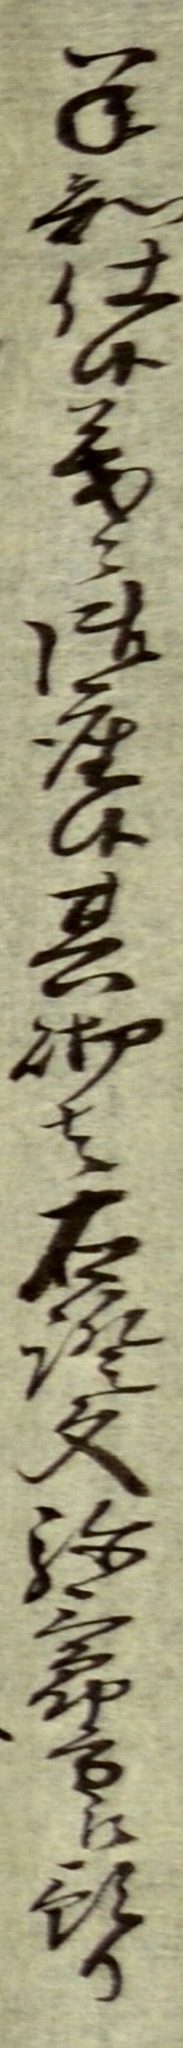承知仕候義ニ御座候其砌者右証文弥三郎方江預り
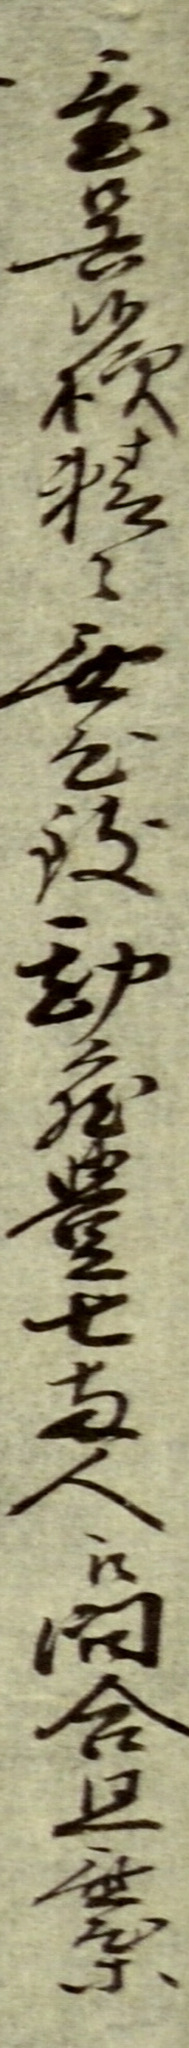置呉候様精々無心致砌勘蔵豊七両人江問合且無心等
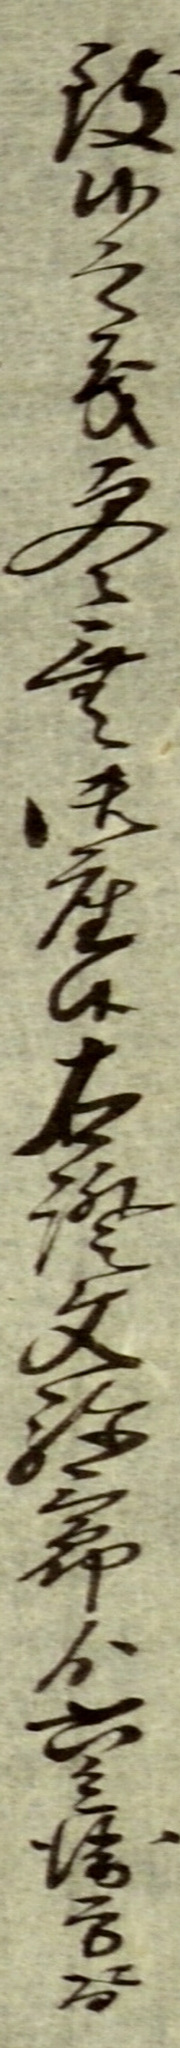致候之義更ニ無御座候右証文弥三郎ゟ六兵衛方ニ而
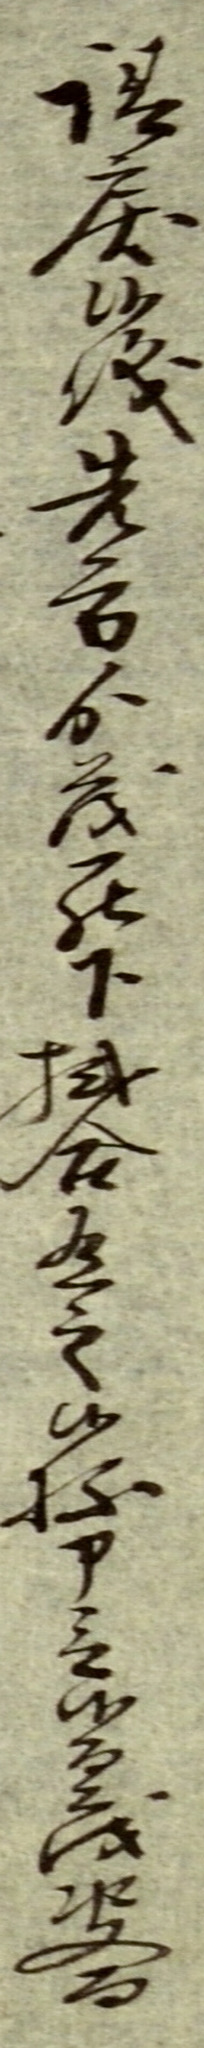請戻候儀先方ゟ茂罷下掛合有之候抔申立候而茂決而
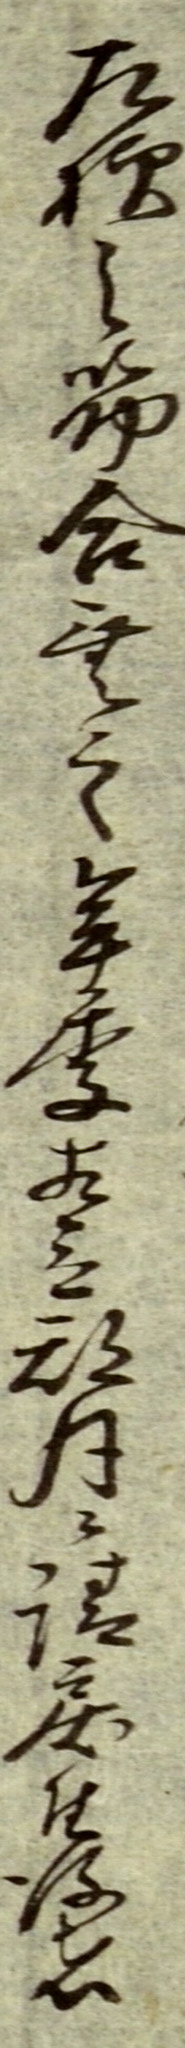左様之筋合無之年季相立期月ニ請戻候後者
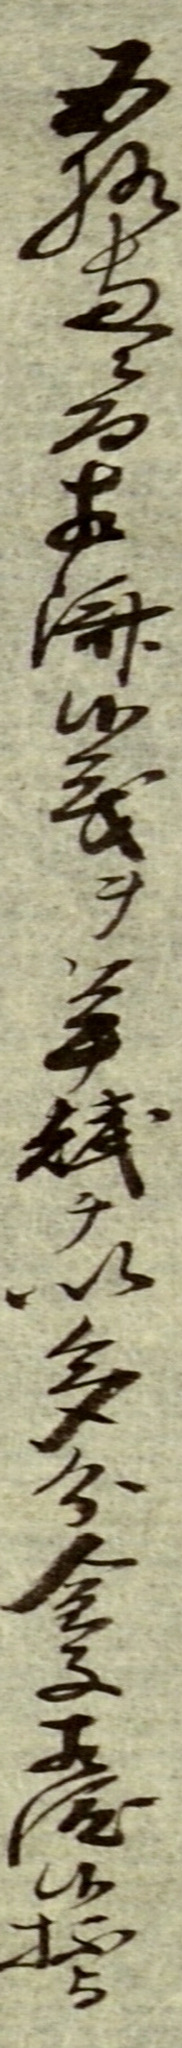五拾両ニ而相済候義ヲ年賦ヲ以多分金子相渡候抔と
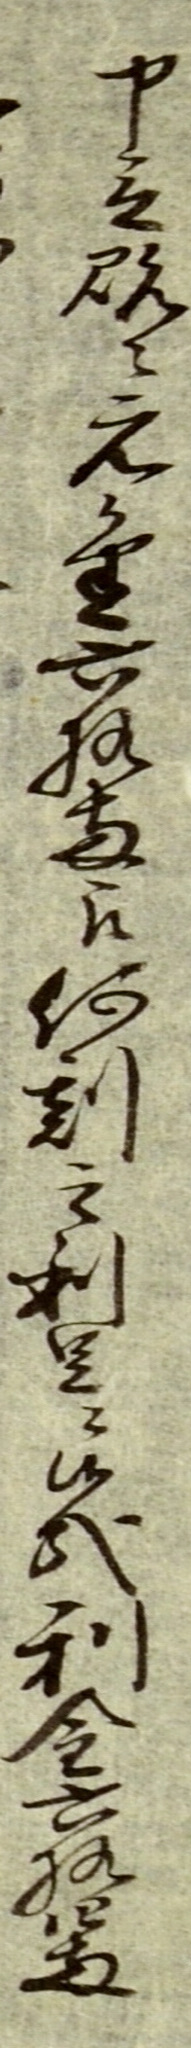申立既ニ元金六拾両江何割之利足ニ候哉利金六拾四両
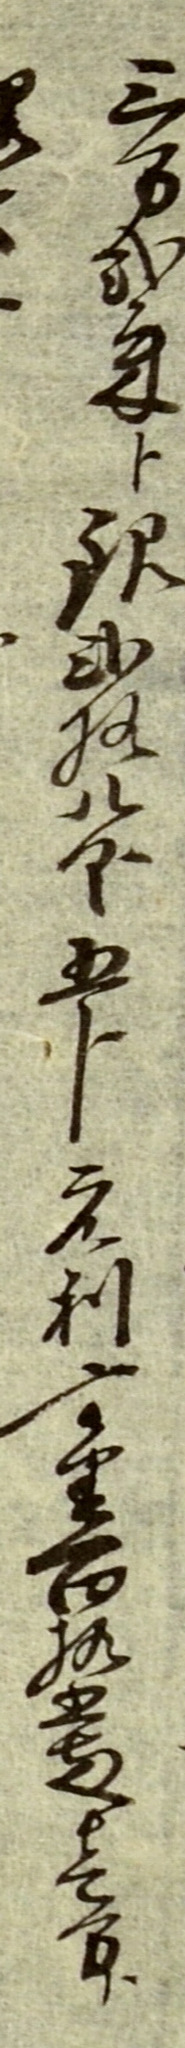三分二朱ト銀弐拾八匁五分元利〆金百拾五両壱分ト
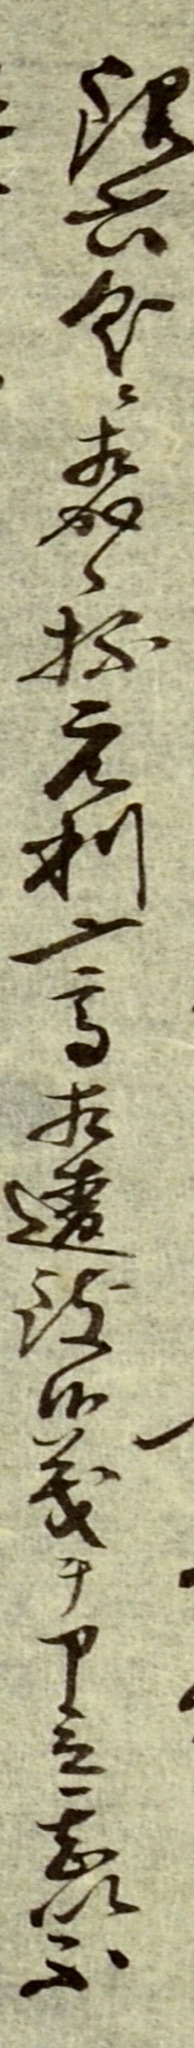銀六匁ニ相成候抔元利〆高相違致候義ヲ申立甚以不
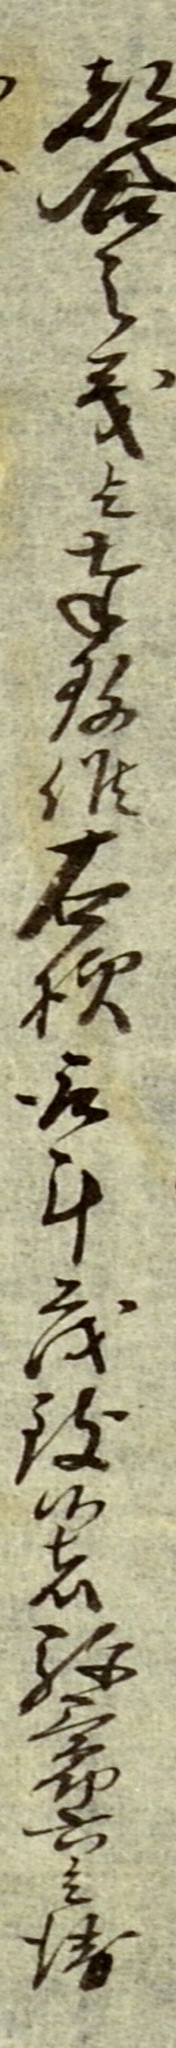都合之義と存奉候右様取計茂致候者弥三郎六兵衛
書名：乍恐以口上書奉申上候御事
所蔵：伊那市立高遠町図書館・合同会社AMANE
